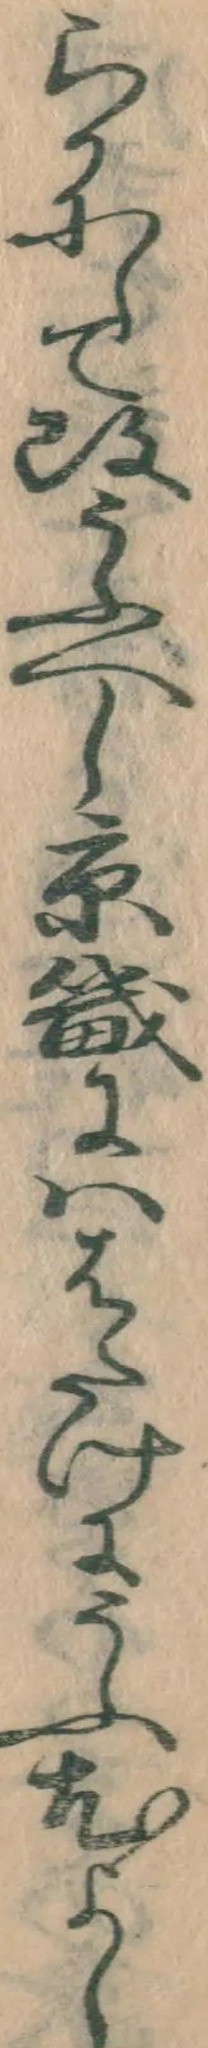らかにして改うふへし京畿にははたけにうふ尤よし
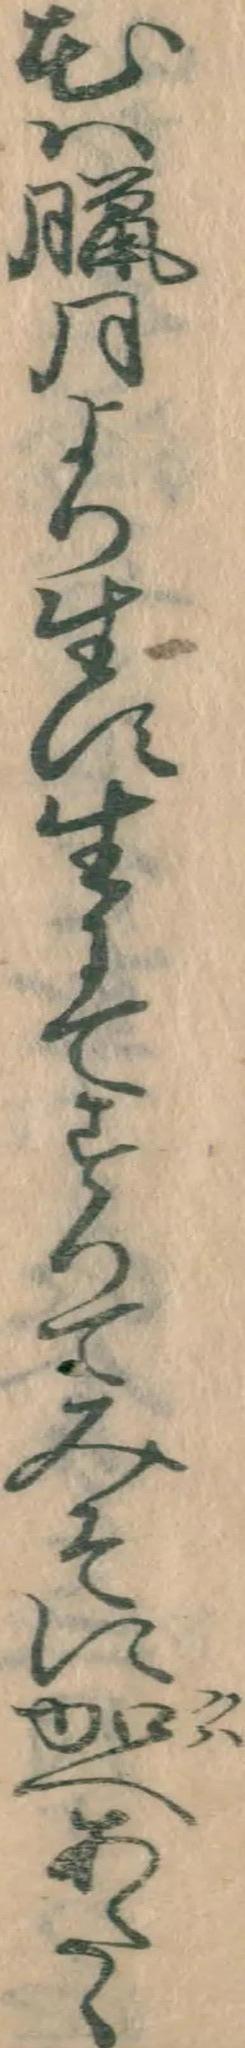花は臘月より生す生にてすりてみそに加へあたゝ
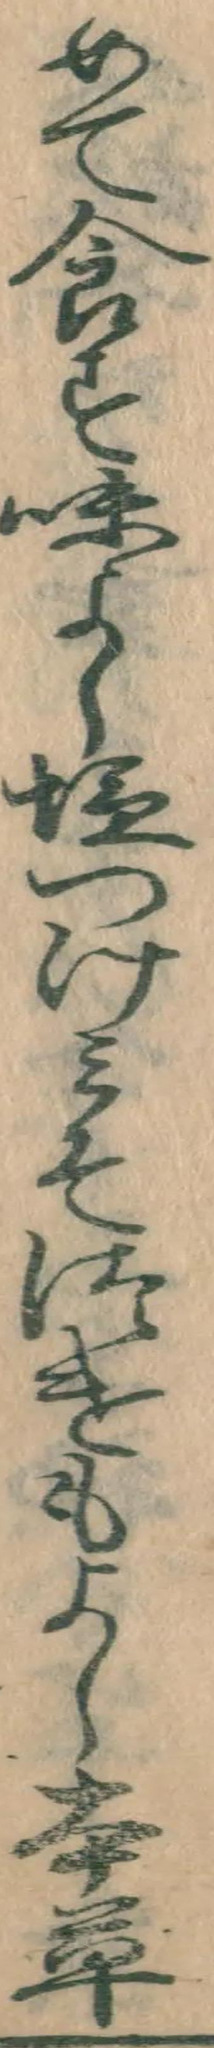めて食す味よし塩つけみそつけもよし本草
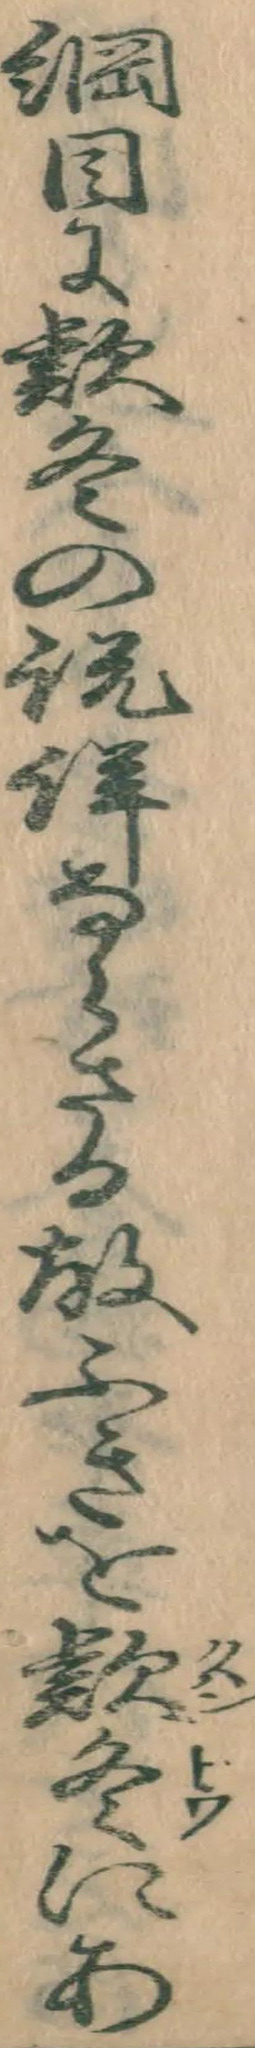綱目に疑冬の説詳ならさる故ふきを疑冬にあ

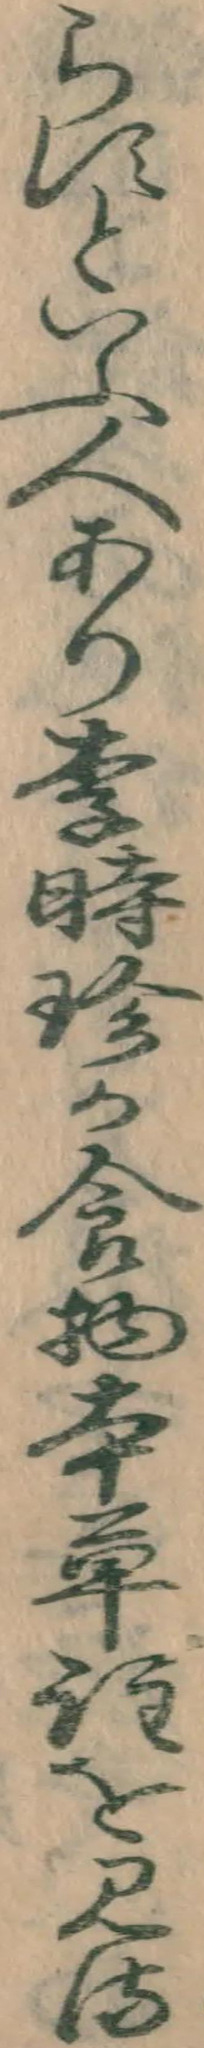らすといふ人あり李時珍か食物本草を見る
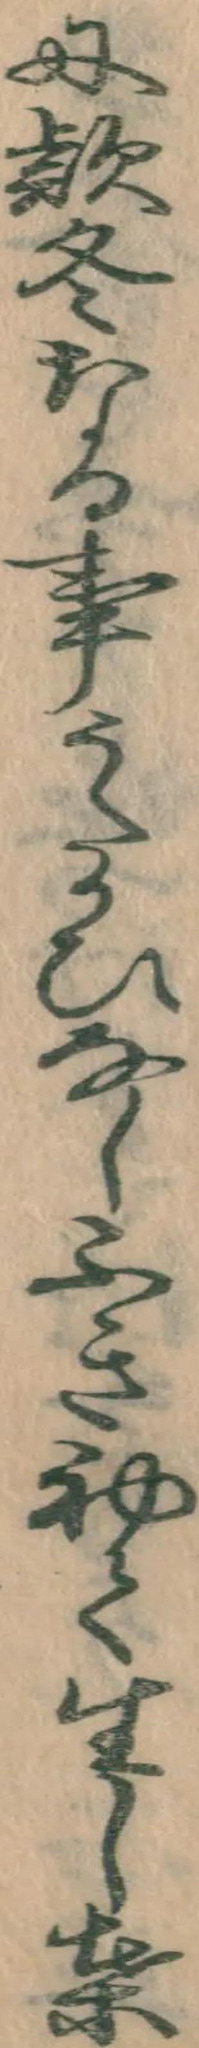に疑冬なる事うたかひなしふき初て生し葉
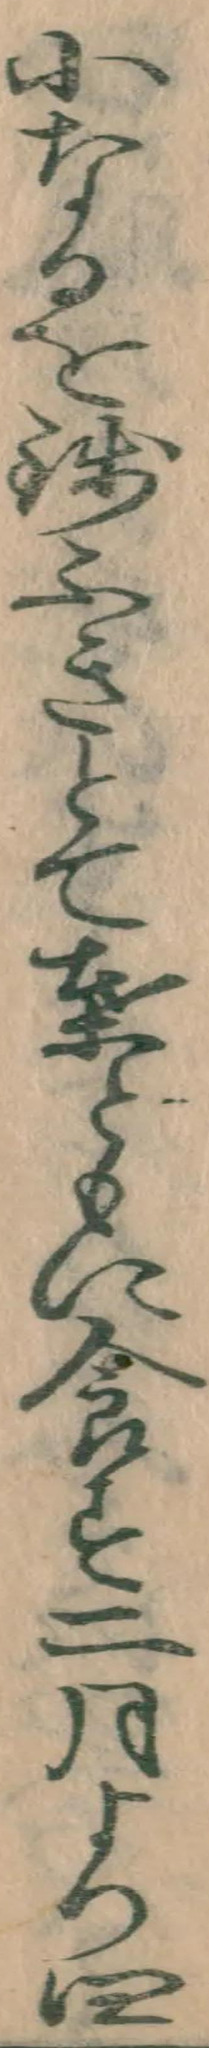小なるを銭ふきとて葉どもに食す二月より四
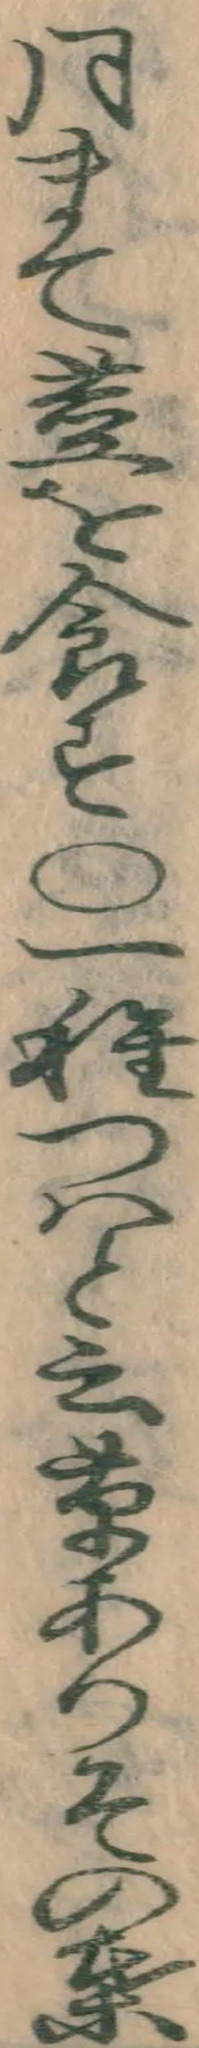月まて茎を食す〇一種つはと云草ありその葉
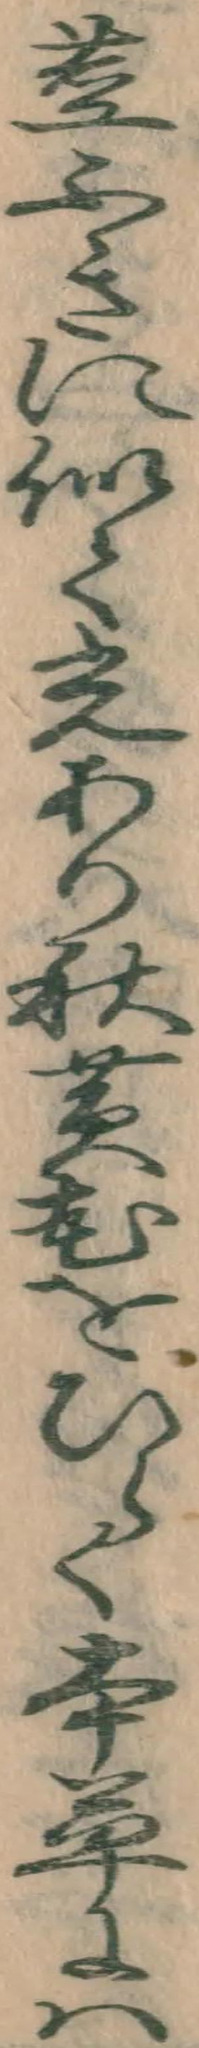茎ふきに似て光あり秋黄花をひらく本草には
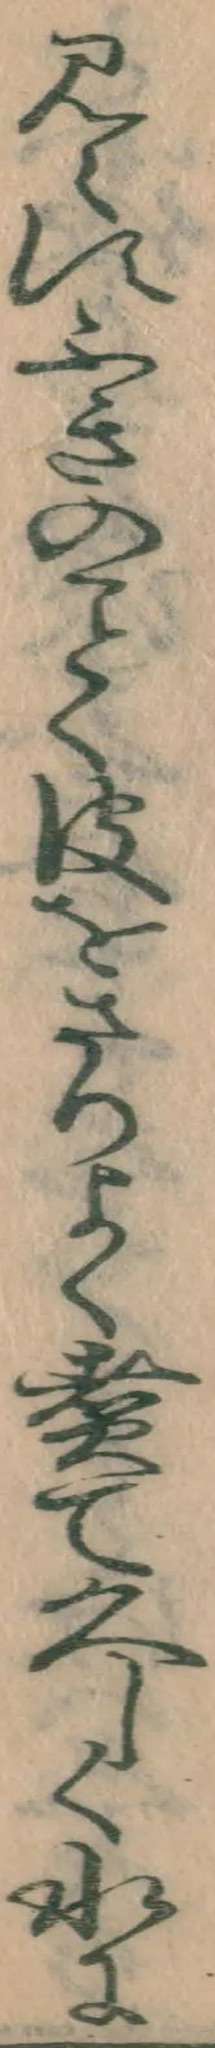見えすふきのことく皮をさりよく煮て久しく水に
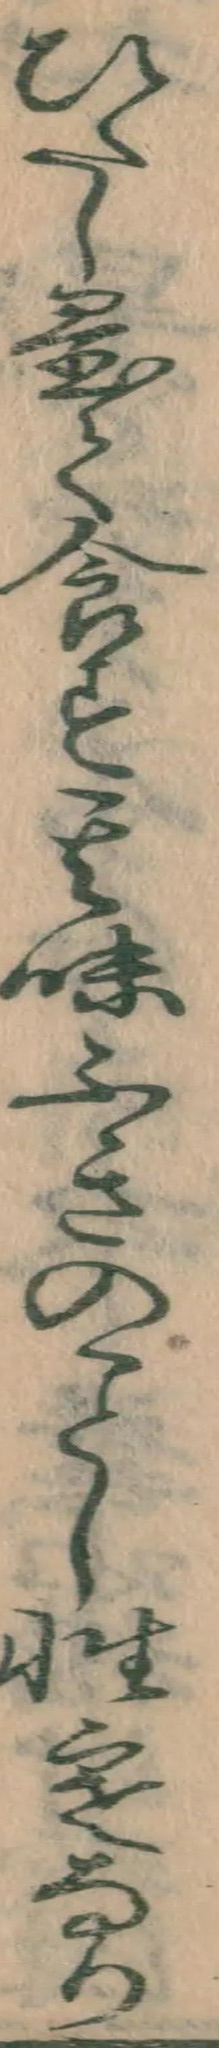ひたし置て食す其味ふきのことし性寒なり
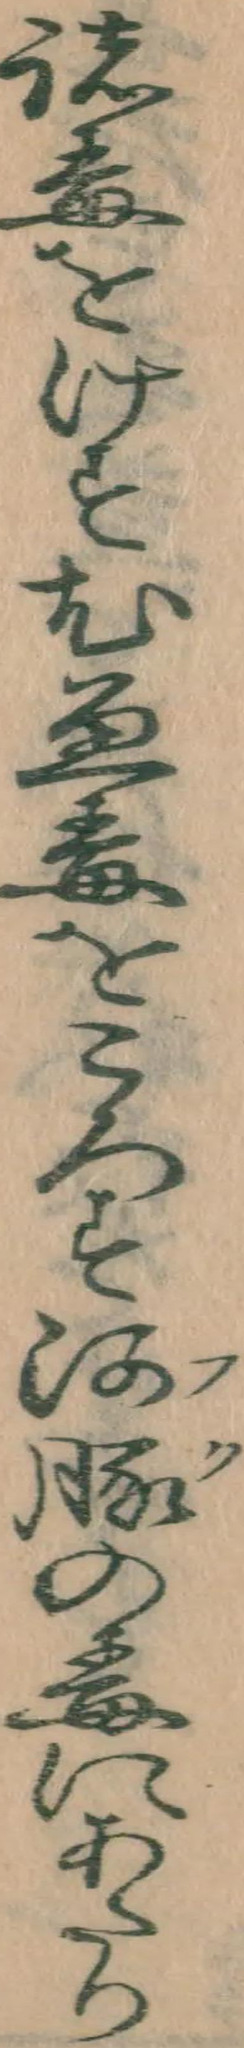諸毒をけす尤魚毒をころす河豚の毒にあたり
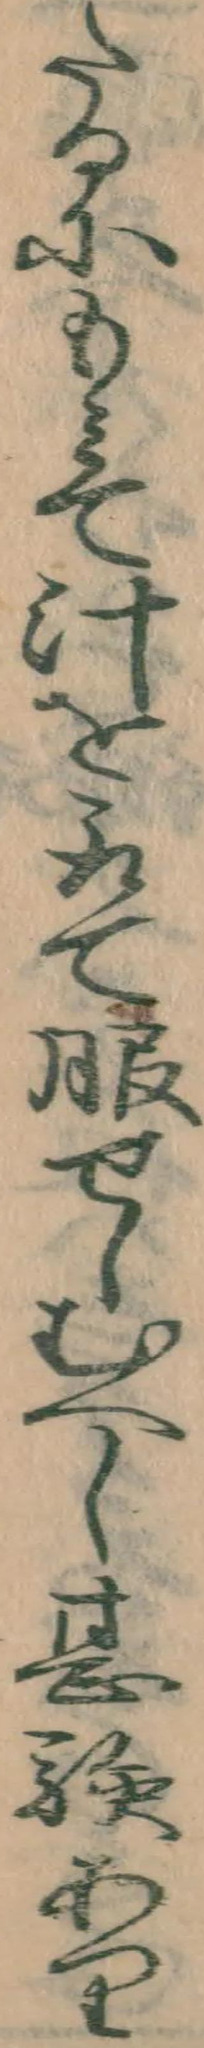たるにもみて汁を取て服せしむへし甚験あり
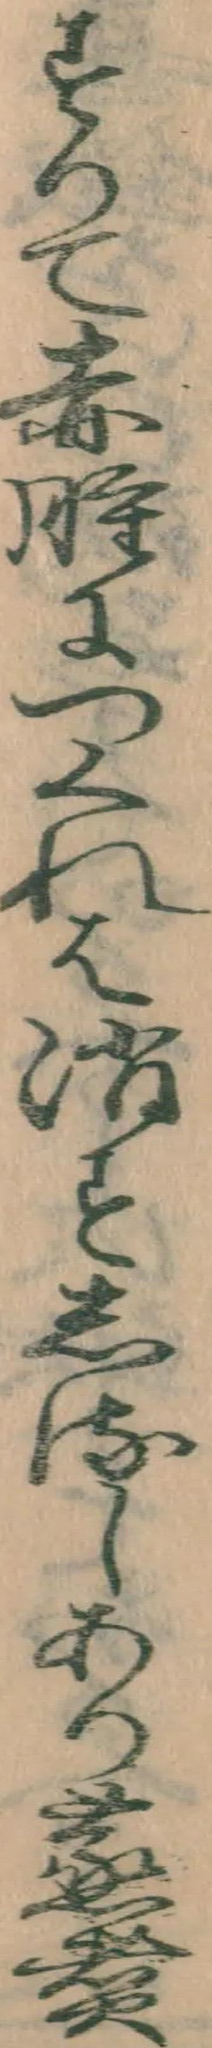すりて赤腫につくれは消すしるしあり蒸煮
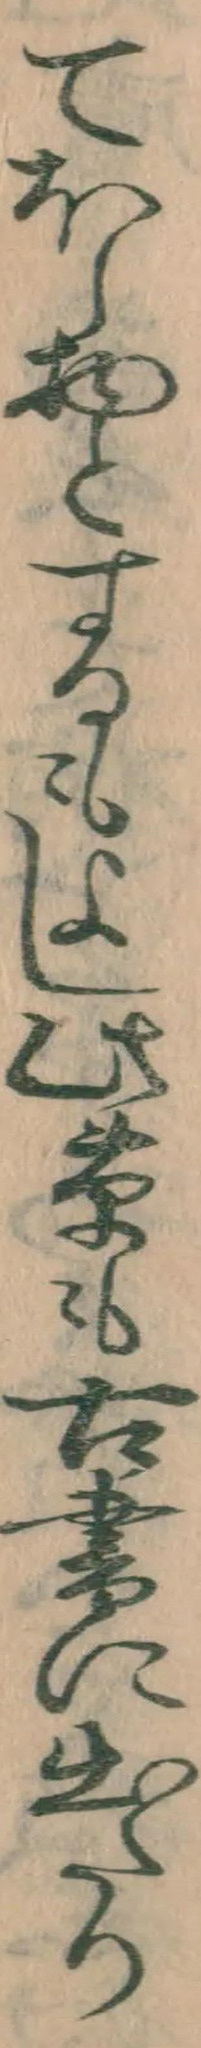てほし物とするもよし此草も古書に出たり
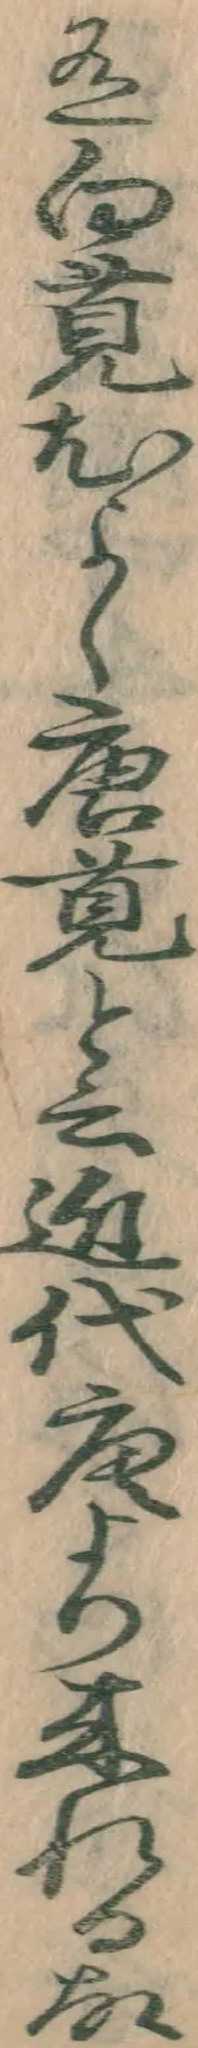有白莧尤よし唐莧と云近代唐より来れる故
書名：菜譜 3巻
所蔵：国立国会図書館 National Diet Library, JAPAN
